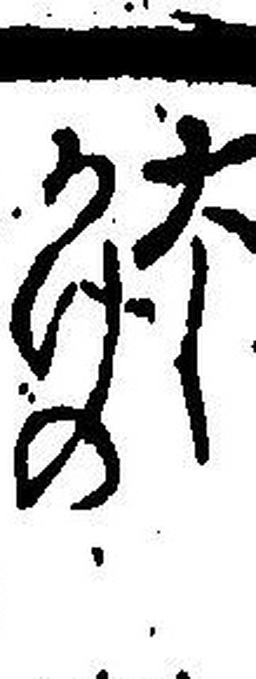かけの
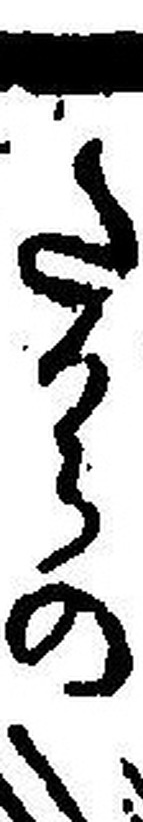たからの
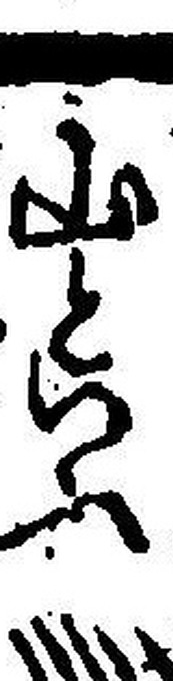山といふ
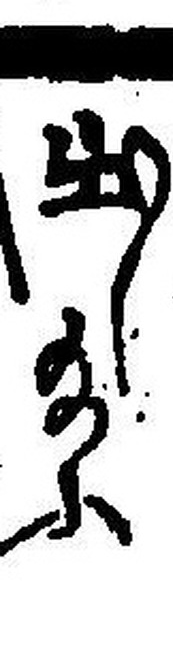出し給ふ
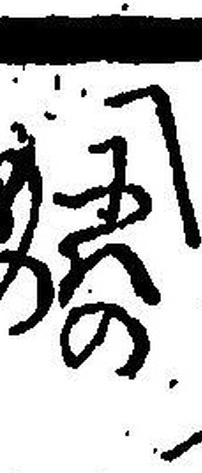〽にはの
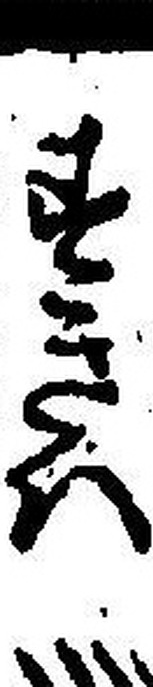すきは
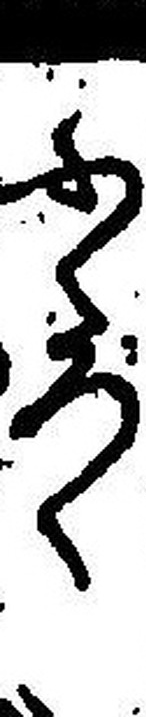ふくろく
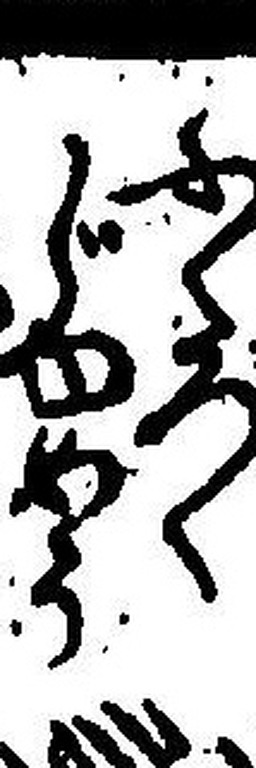じゆめう
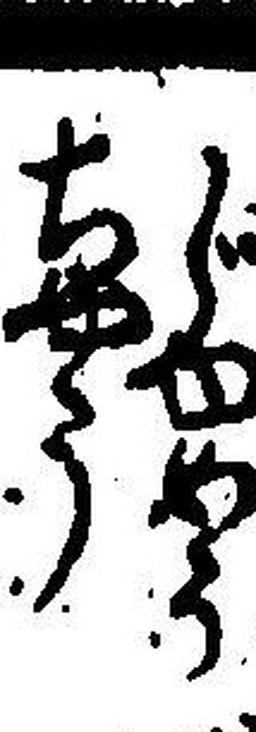ちやう
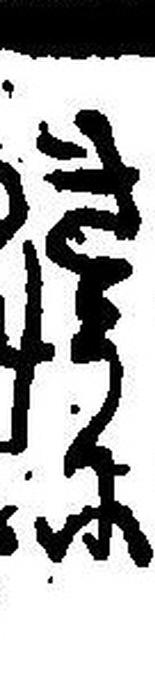きうに
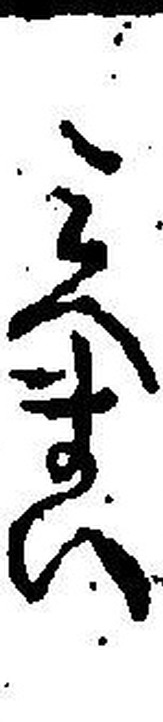みへまい

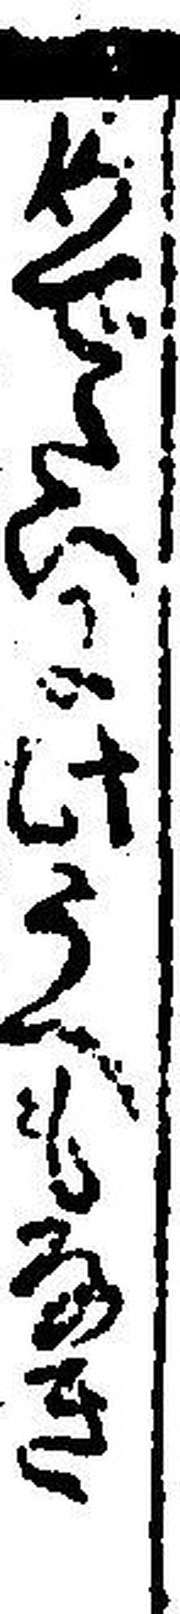めでたいに此うへもなき
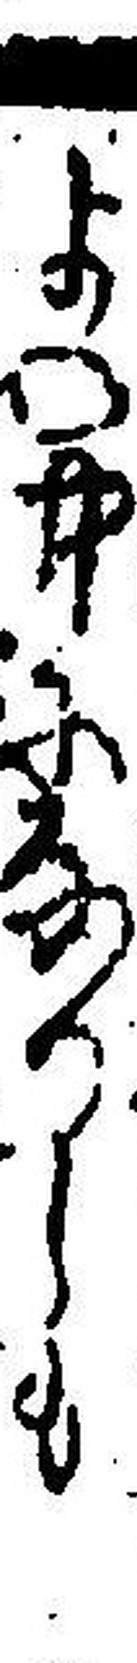よの中になりしも
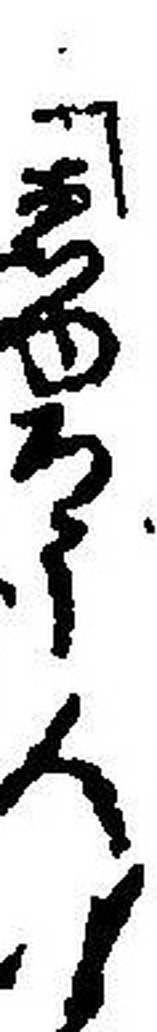〽しゆろう人
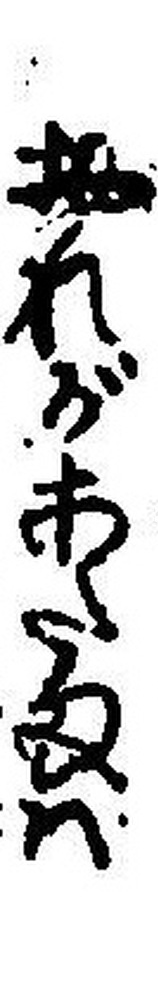おれがあたまは
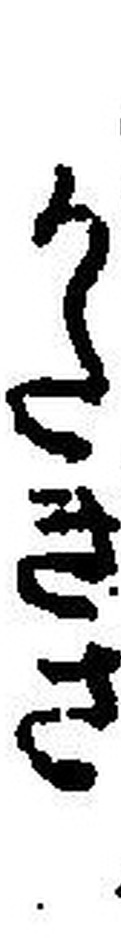かたぎさ
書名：徳若水縁起金性 / 樹下石上作
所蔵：東京大学総合図書館 General Library in the University of Tokyo, JAPAN
